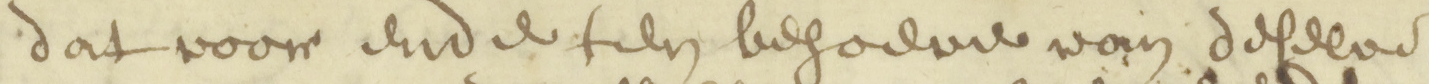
dat voor ende ten behoeve van deselve
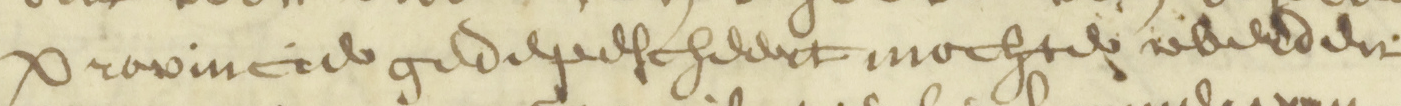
Provincie gedepescheert mochte werden
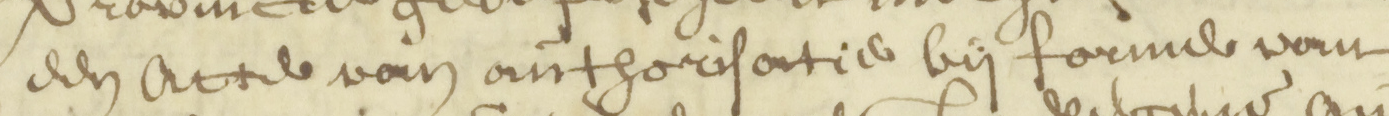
een Acte van authorisatie bij forme van
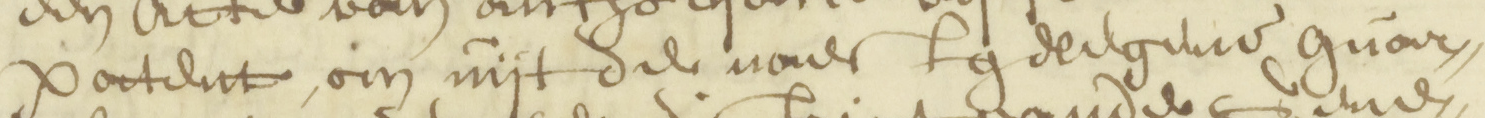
Patent, om uijt de naestgelegene guar„
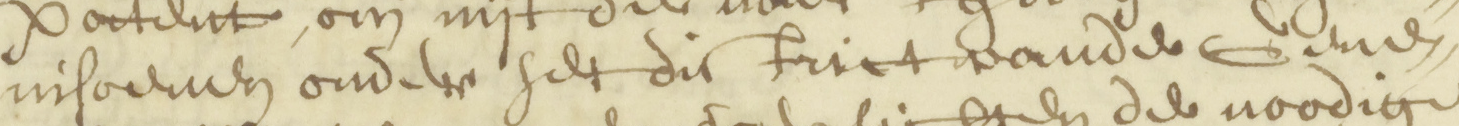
nisoenen onder het district vande Gene„
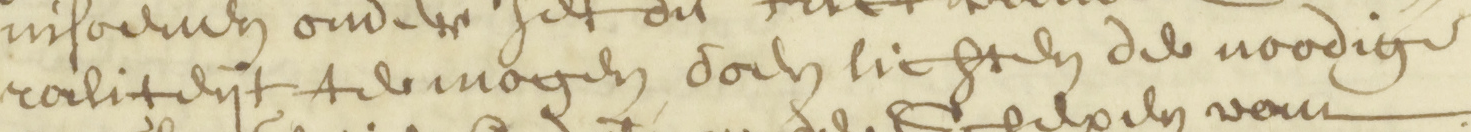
raliteijt te mogen doen lichten de noodige
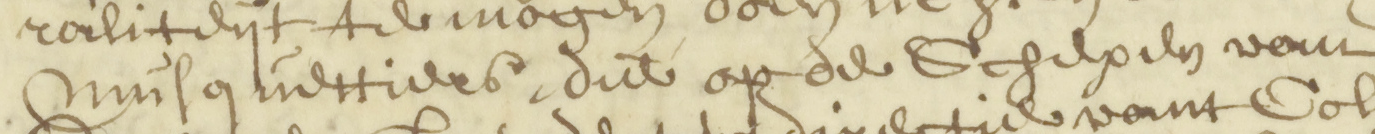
Musquettiers, die opde Schepen van
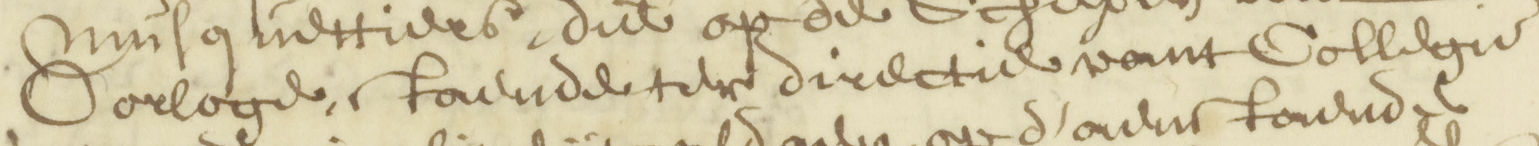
Oorloge, staende ter directie vant Collegie
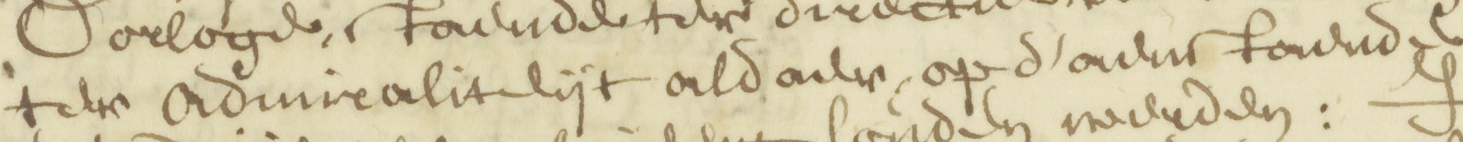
ter Admiraliteijt aldaer, op d'aenstaende
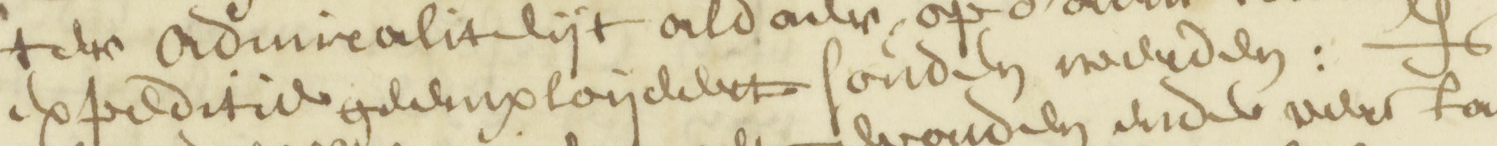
expeditie geemploijeert souden werden: Is
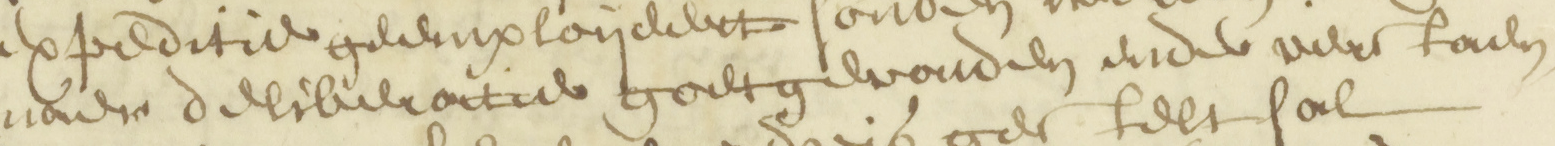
naer deliberatie goetgevonden ende verstaen,
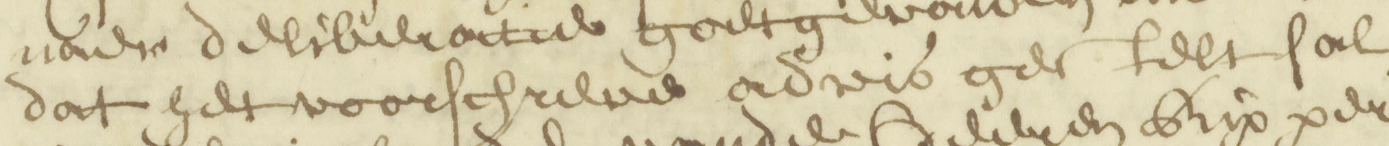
dat het voorschreve advis gestelt sal
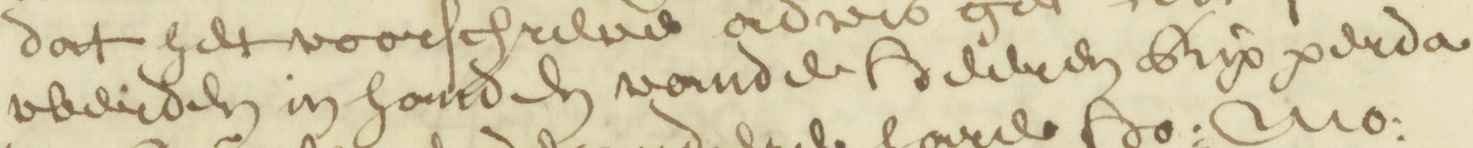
werden in handen vande Heeren Ripperda
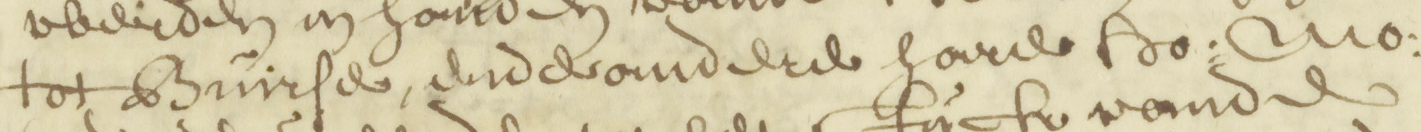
tot Buirse, ende andere hare Ho:Mo:
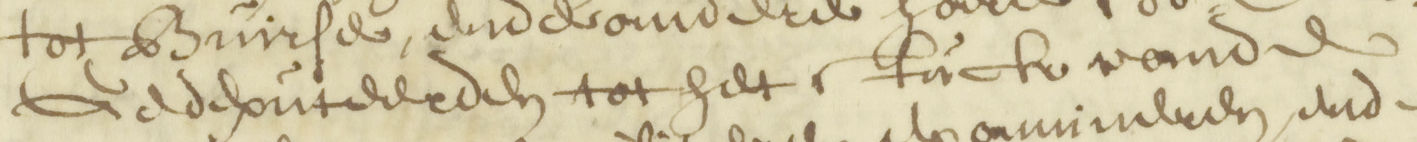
Gedeputeerden tot het stuck vande
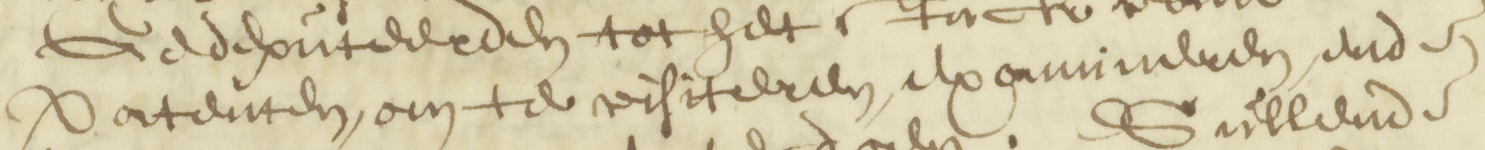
Patenten, om te visiteren, examineren, ende
